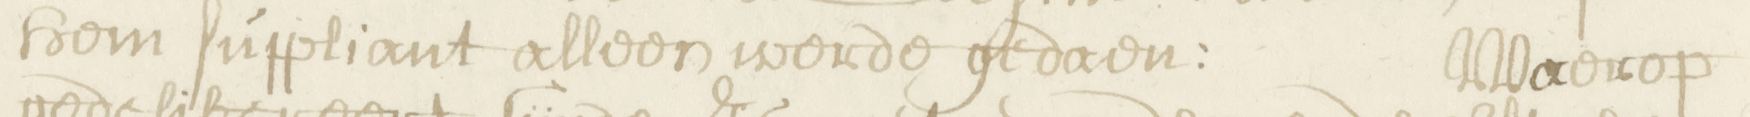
hem suppliant alleen werde gedaen: Waerop
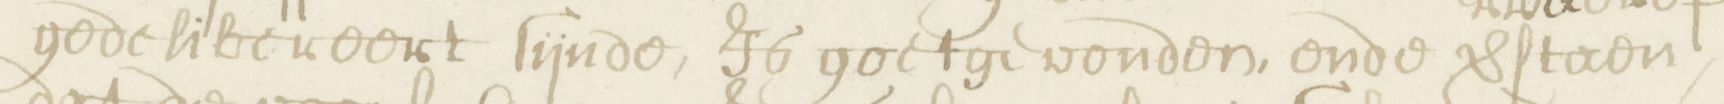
gedelibereert sijnde, Is goetgevonden, ende vstaen
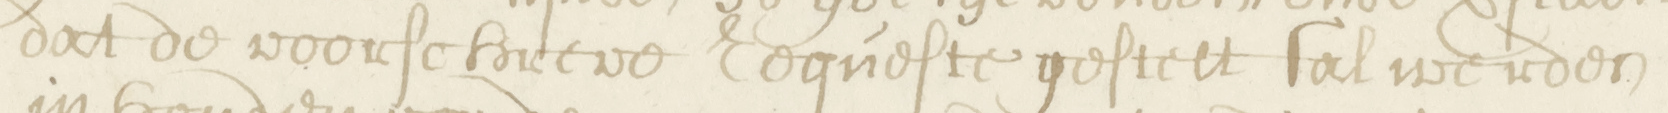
dat de voorschreve Requeste gestelt sal werden
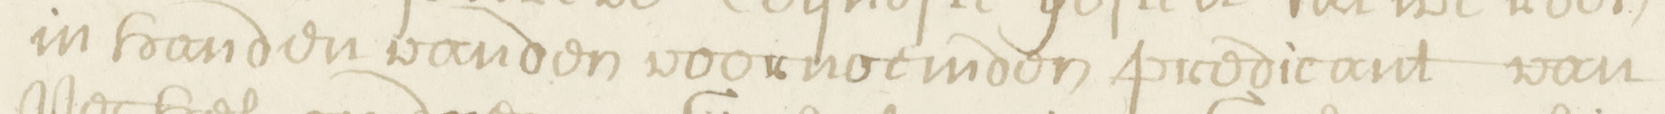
in handen vanden voornoemden predicant van
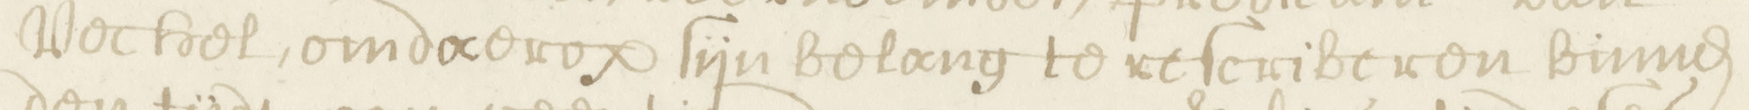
Vechel, omdaerop sijn belang te rescriberen binnen
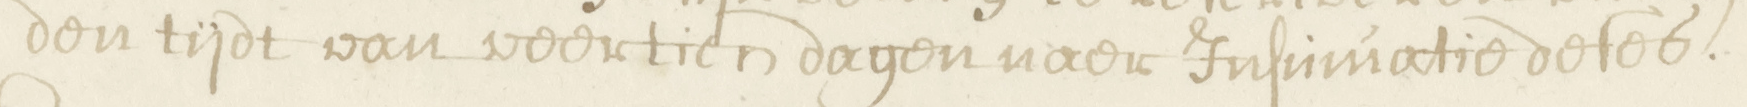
den tijdt van veertien dagen naer Insinuatie deses.
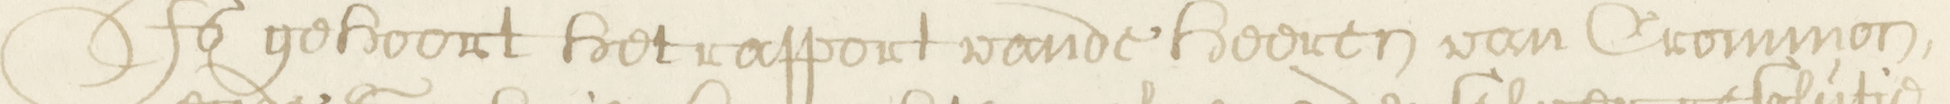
Is gehoort het rapport vande heeren van Crommen,
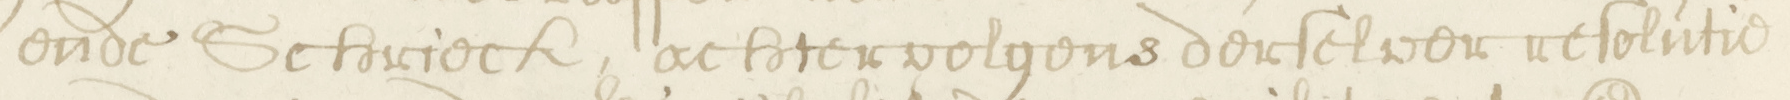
ende Schrieck, achtervolgens derselver resolutie
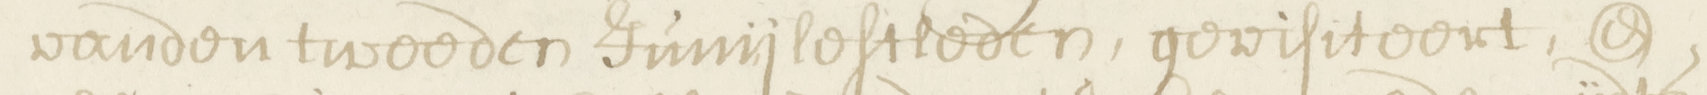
vanden tweeden Junij lestleden, gevisiteert, &
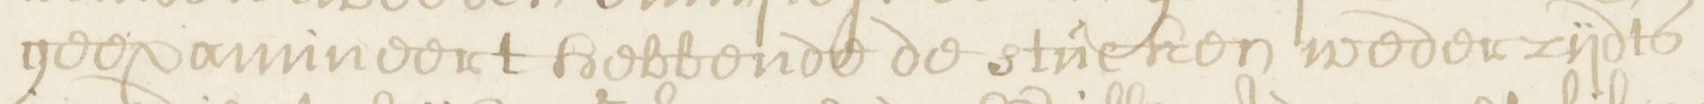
geexamineert hebbende de stucken wederzijdts
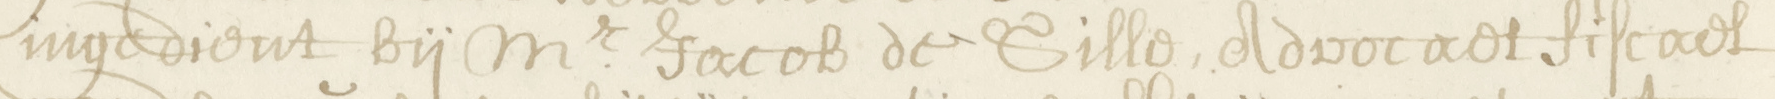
ingedient bij Mr. Jacob de Sille, Advocaet Fiscael
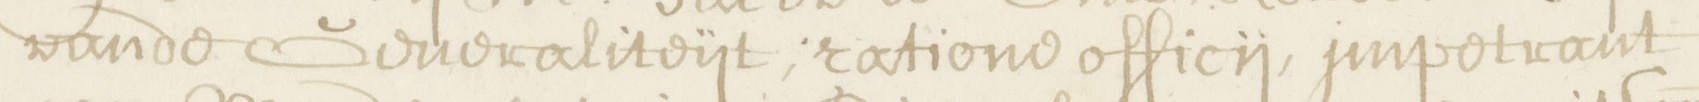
vande Generaliteijt, ratione officij, impetrant
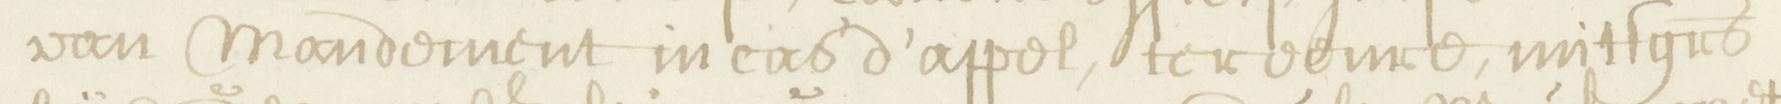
van Mandement in cas d'appel, ter eenre, mitsgrs
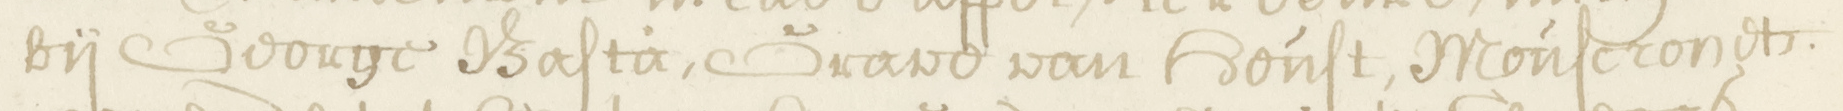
bij George Basta, Grave van Heust, Mouscron etc.
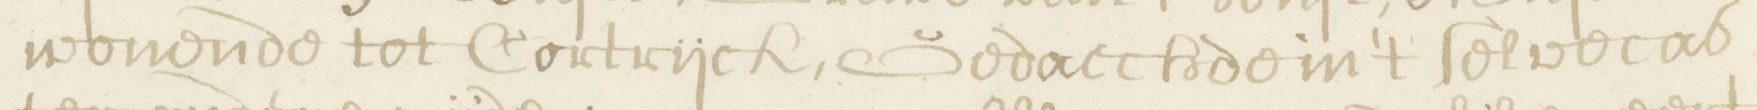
wonende tot Cortrijck, Gedaechde in't selve cas
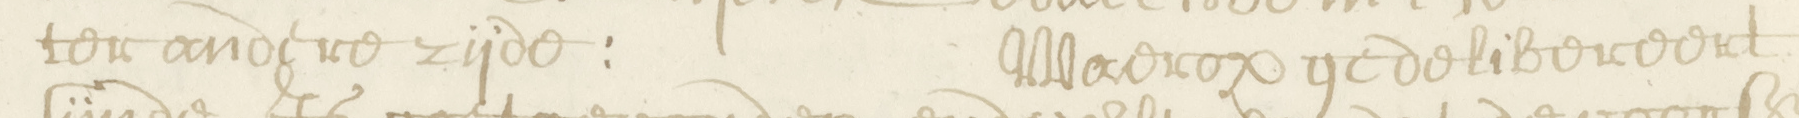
ter andere zijde: Waerop gedelibereert
